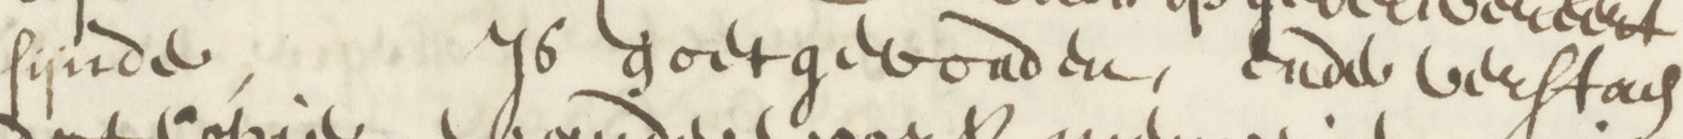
sijnde, Is goetgevonden, ende verstaen
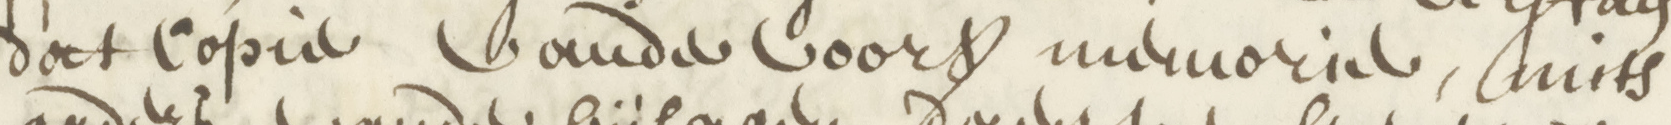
dat Copie vande voors memorie, mits
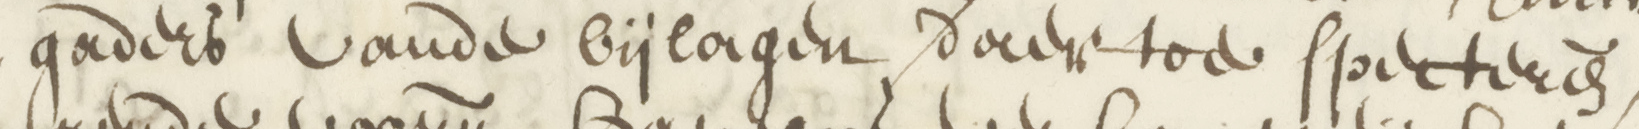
„gaders vande bijlagen daer toe specteren
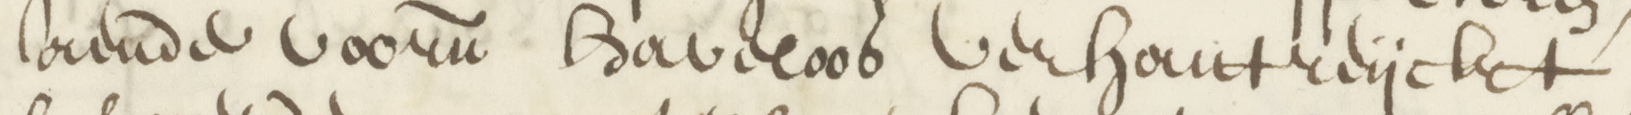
aende voorn. Haveloos verhantreijckt
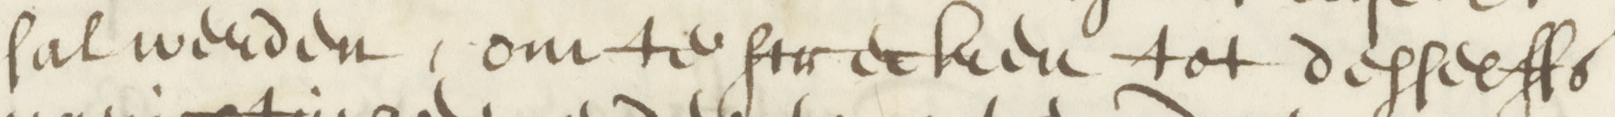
sal werden, om te strecken tot desselffs
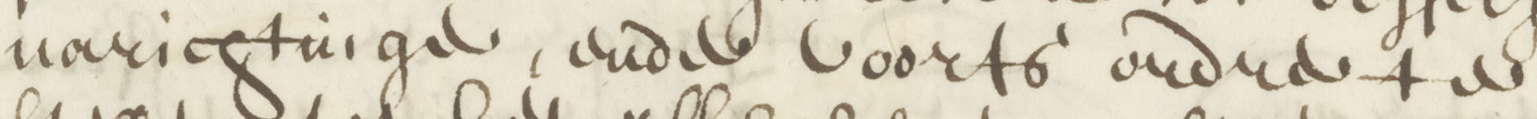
narichtinge, ende voorts ordre te
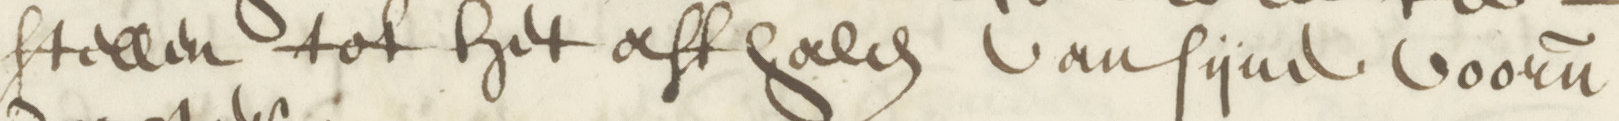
stellen tot het affhalen van sijne voorn
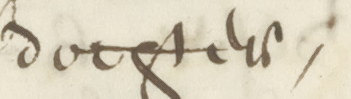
dochter.
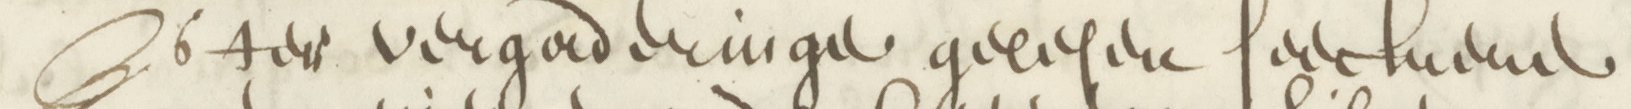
Is ter Vergaderinge gelesen seeckene
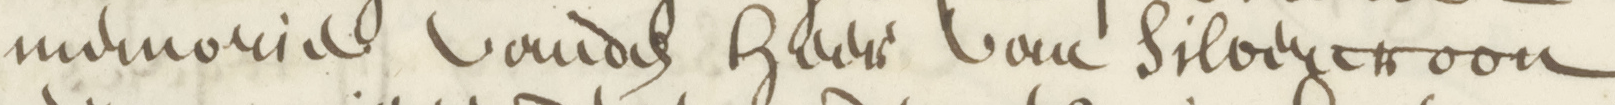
memorie vanden heer van Silvercroon
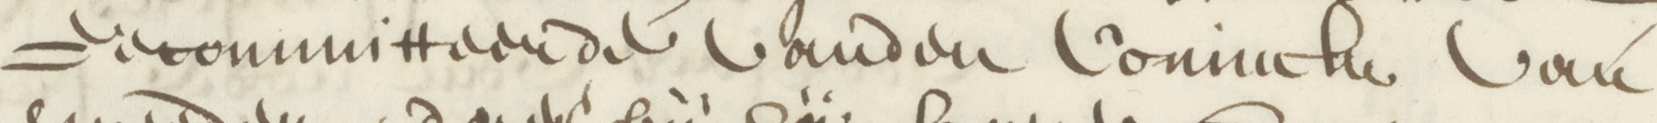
Gecommitteerde vanden Coninck van
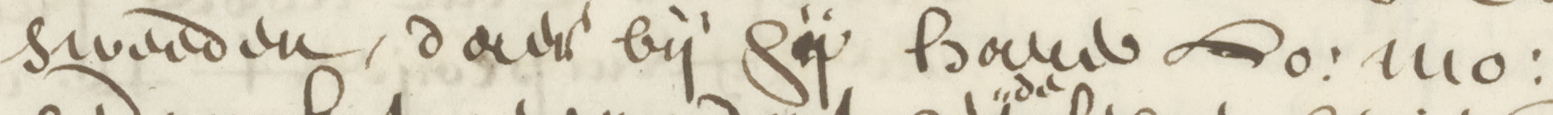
sweeden, daer bij hij haer Ho:Mo:
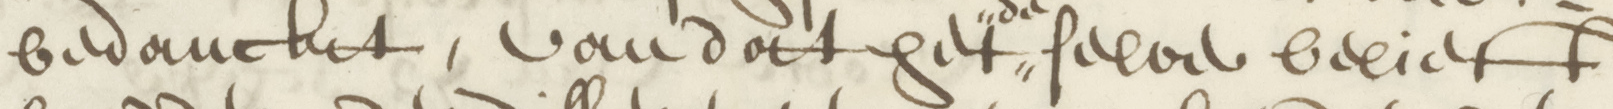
bedanckt, van dat het de selve belieft
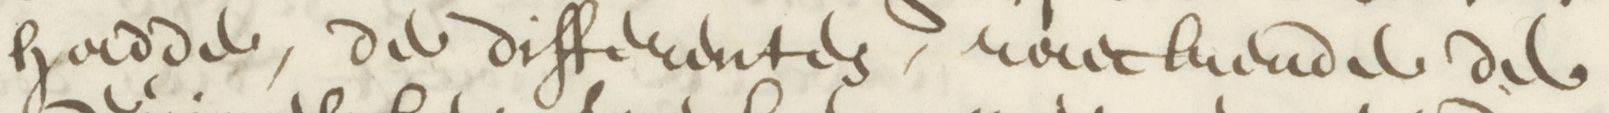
hadde, de differenten, raeckende de
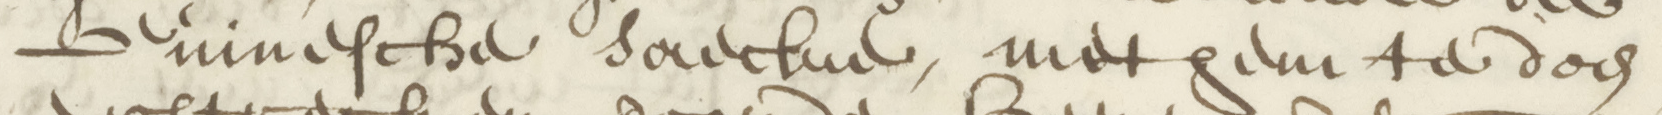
Guinesche saecke, met hem te doen
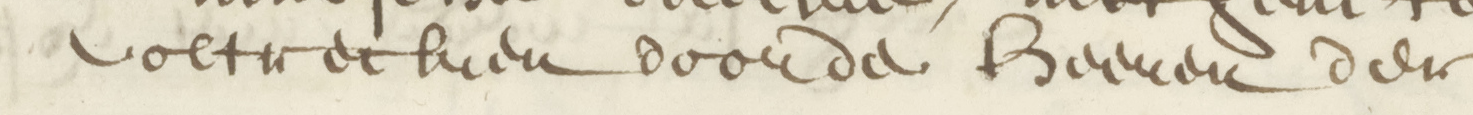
voltrecken door de heeren der
